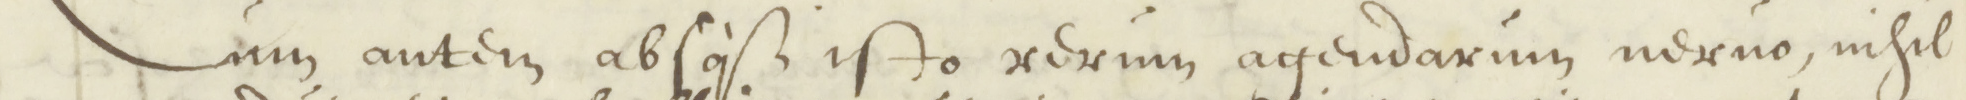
Cum antem absq isto verum agendarum neruo, nihil
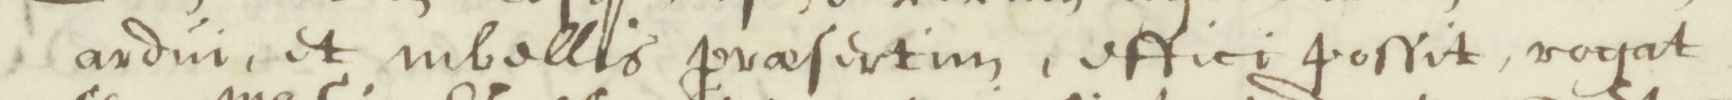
ardui, et inbellis præsertim, effici possit, rogat
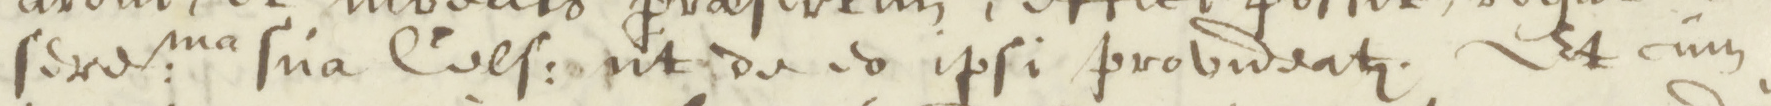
serema: sua Cels: ut de eo ipsi provideat. Et cum
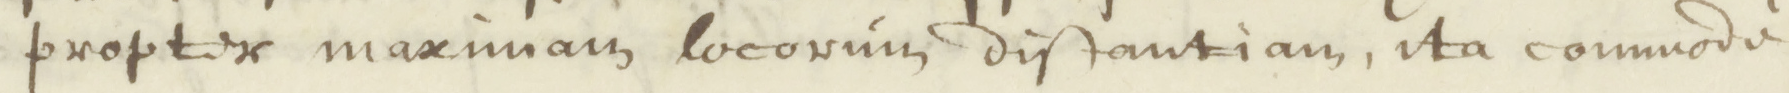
propter maximam locorum distantiam, ita commode
